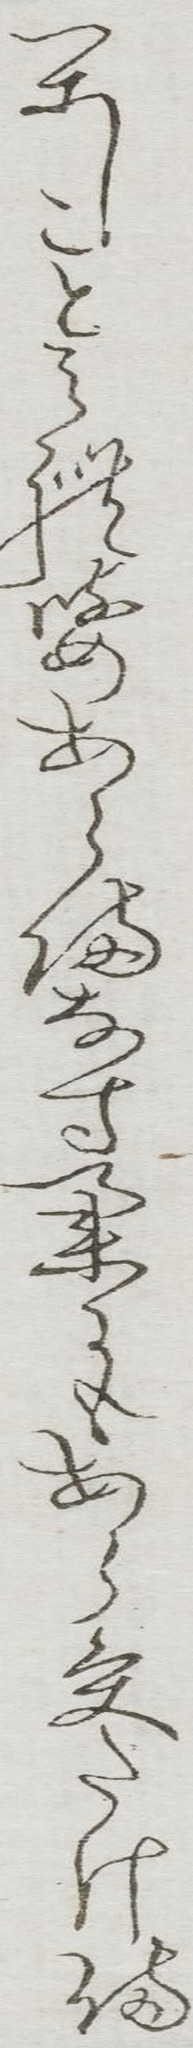かしことみれはあらひなす業にもあらすたけひ
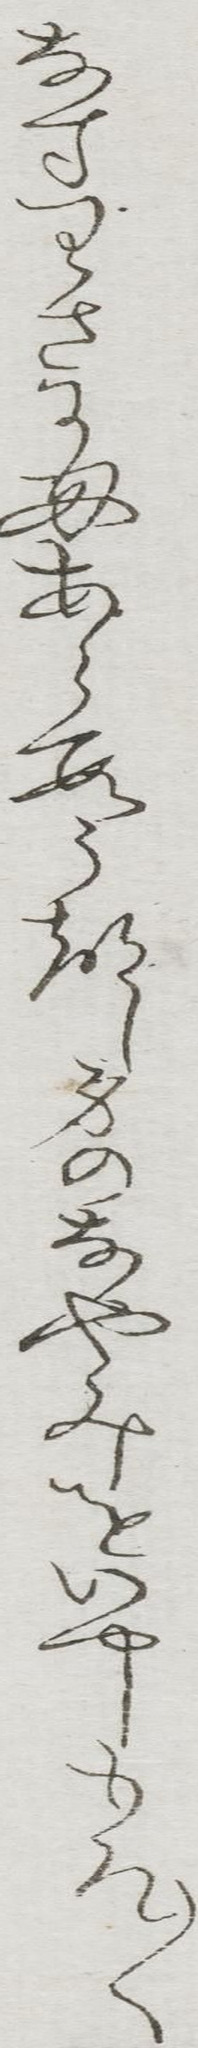なすわさにもあらすうつし身のなやみをいやしもろ〳〵
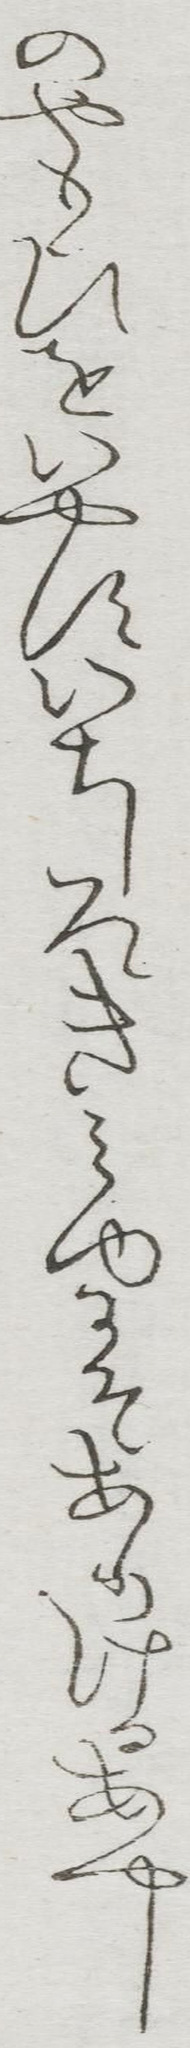のやもひをいやすいちしろきみゆにそありけるあやし
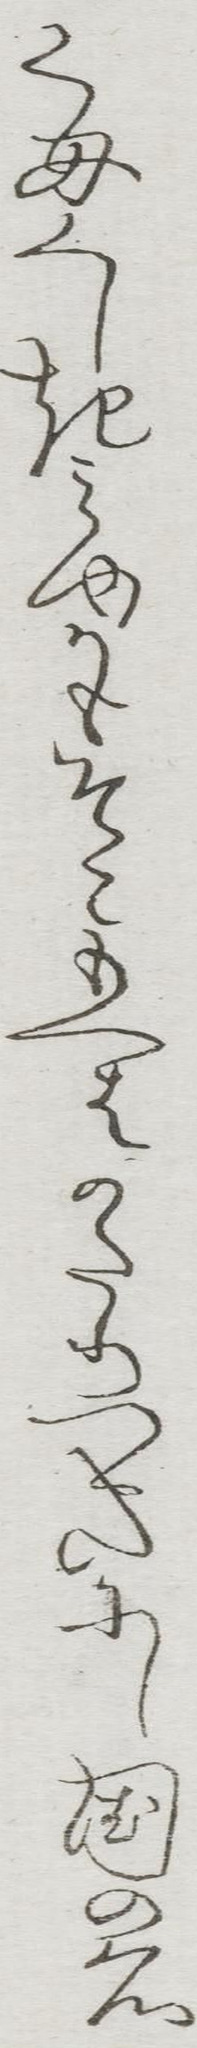くもくしきみゆかもそこもへはかたりつきにし国の名
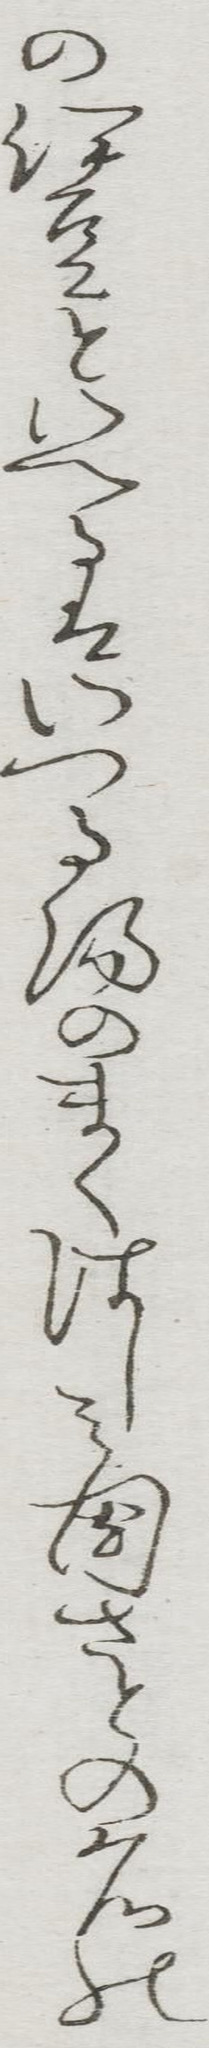の伊豆といへるはいつる湯のまくはしみ国さとの名の
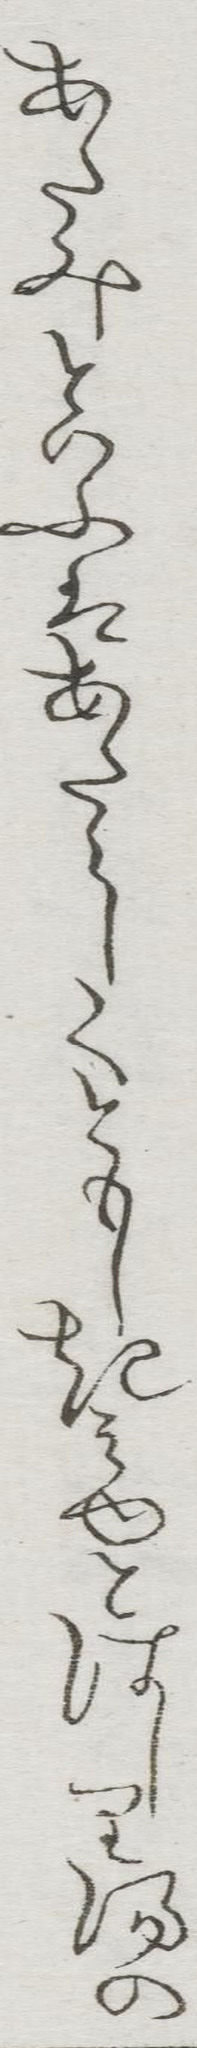あたみといふはあたらしくともしきみゆとはしり湯の
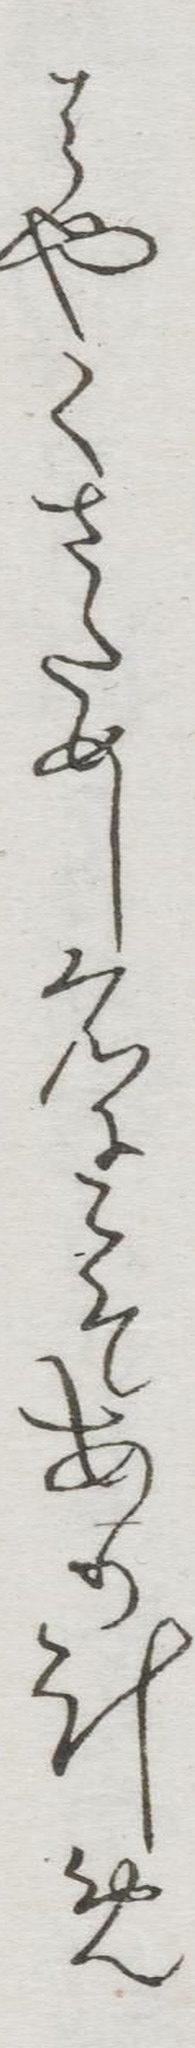はやくさためし名にこそありけめ
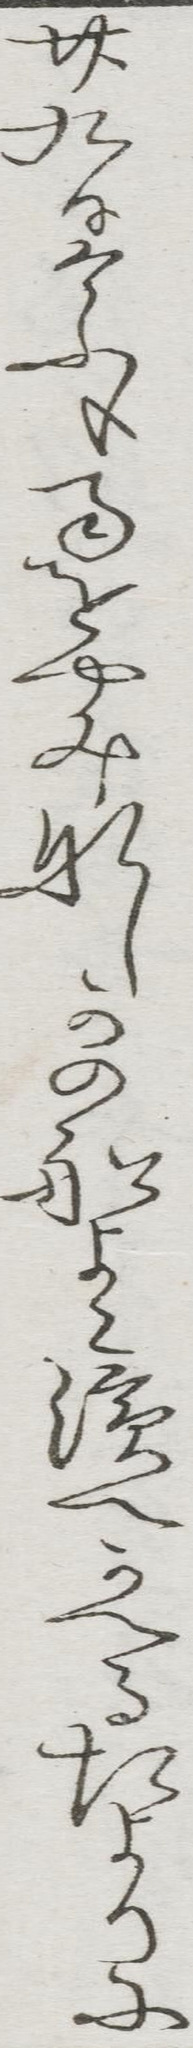廿九日けふも雨をやみなしかの船よと浜へかへるたよりに
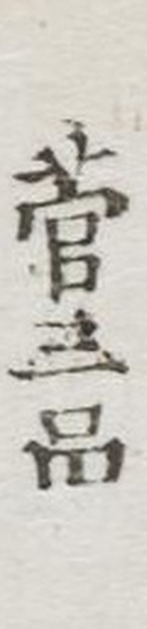菅三品
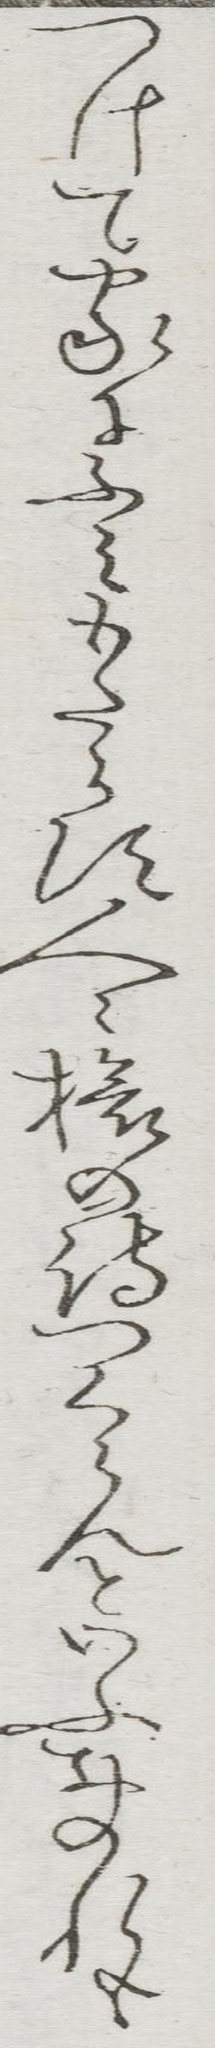つけて家にふみもたらす人々旅の詩つくらんといふおのれも
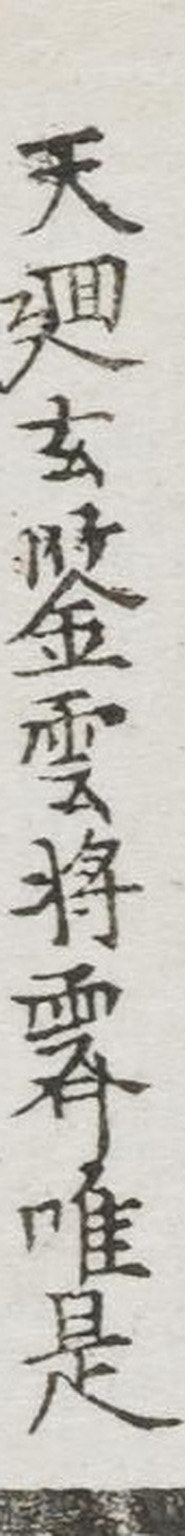天廻玄鑑雲将霽唯是
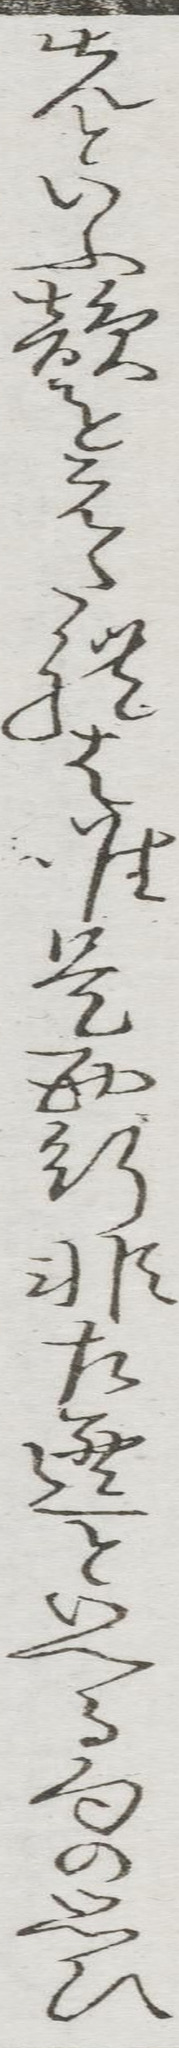先といふ韻をえたれは唯是西行非左遷といへる句の思ひ
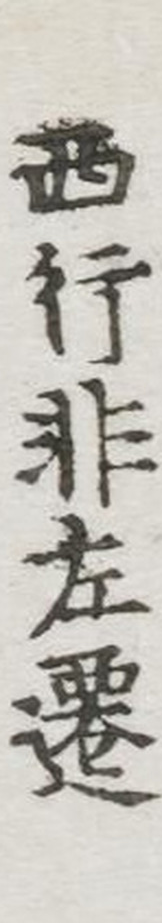西行非左遷
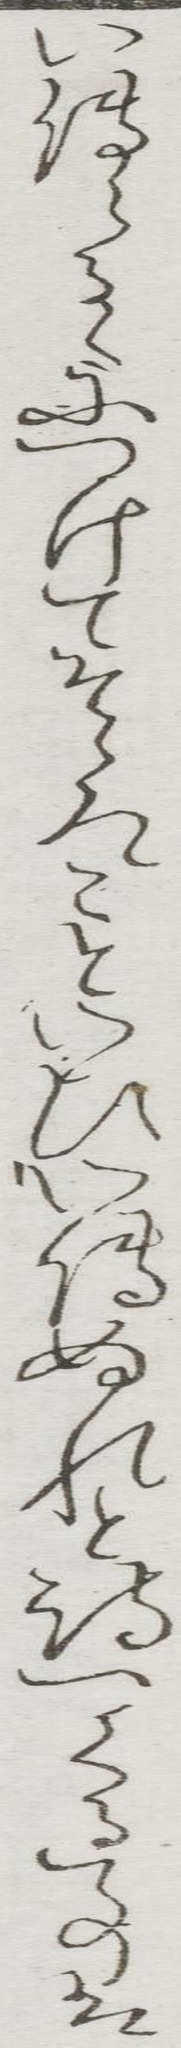いてらるゝにつけてそゝろこといひいてぬれと詩つくる事は
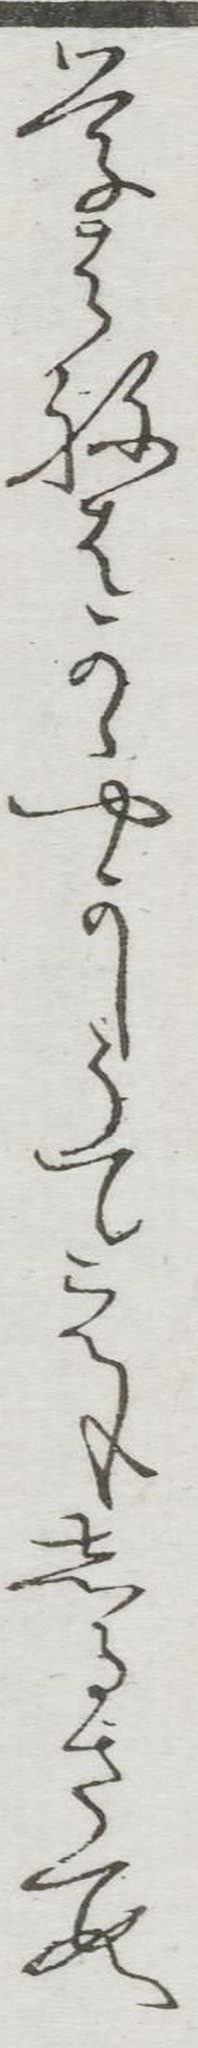学はねはかゝやかしうてえもしるさす
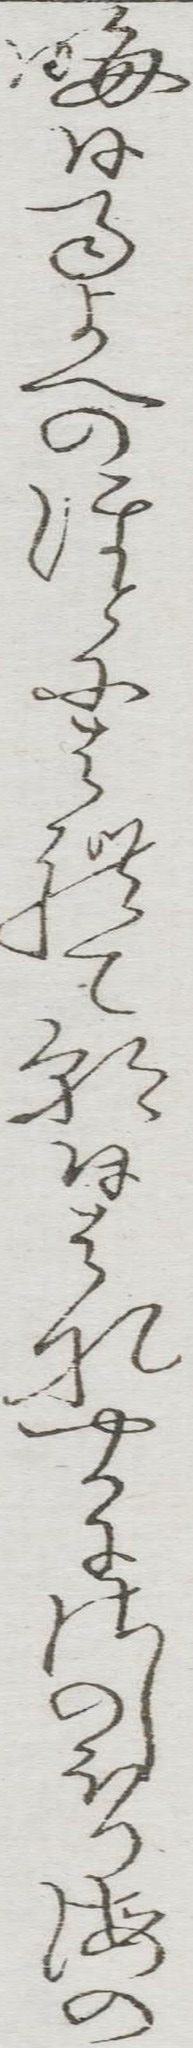晦日雨よへのほとにはれて朝日はれやかにさしのほり海の
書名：挿画熱海日記　全
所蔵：東京大学地震研究所図書室 Earthquake Research Institute Library, The University of Tokyo, JAPAN
